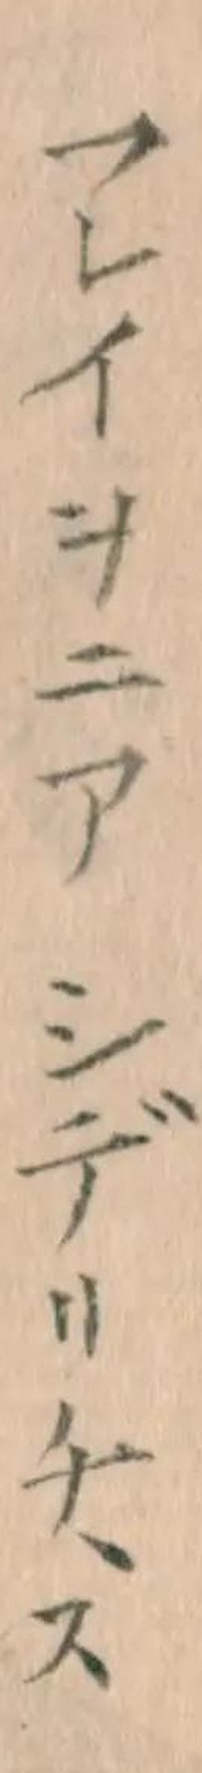フレイヲニアシデリチヽス
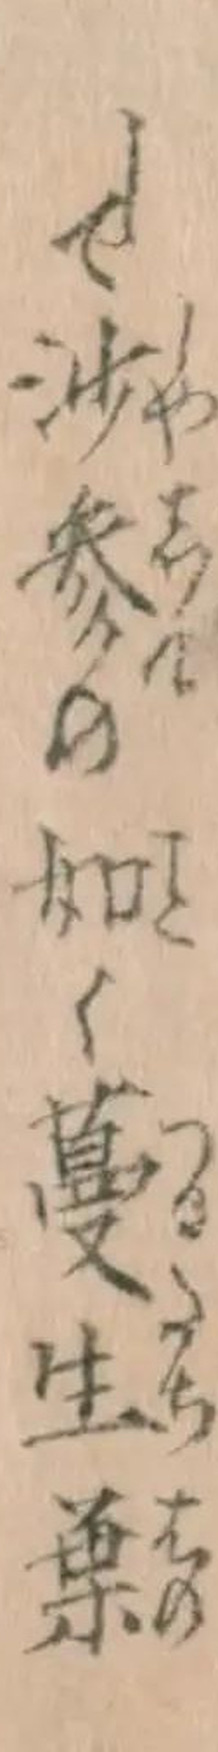して沙参の如く蔓生葉
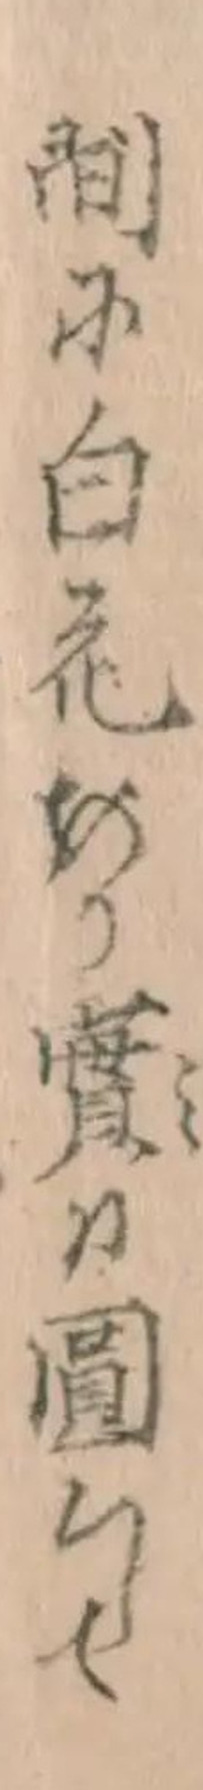間に白花あり実は円くして
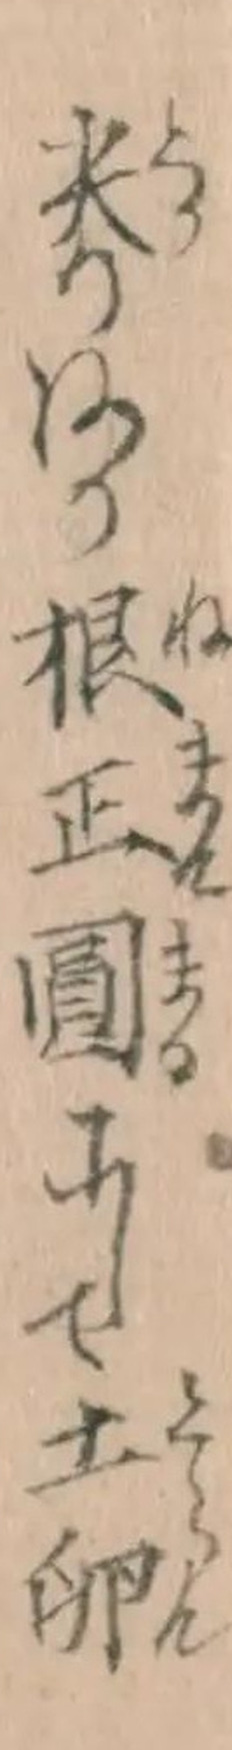尖りあり根正円にして土卵
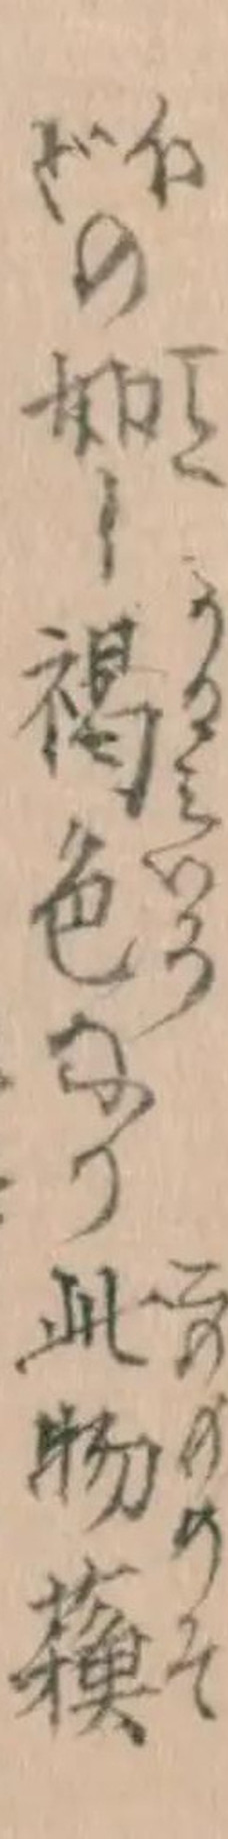ほどの如し褐色なり此物蘇

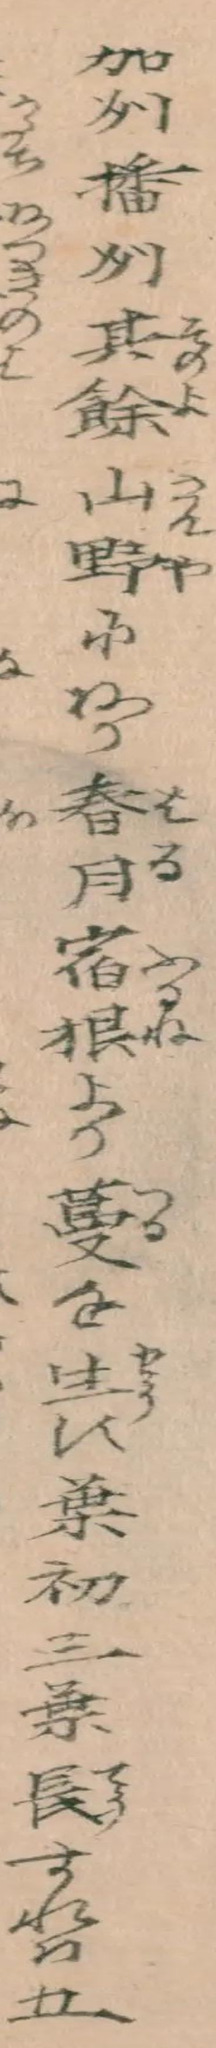加州播州其余山野にあり春月宿根より蔓を生す葉初三葉長すれは五
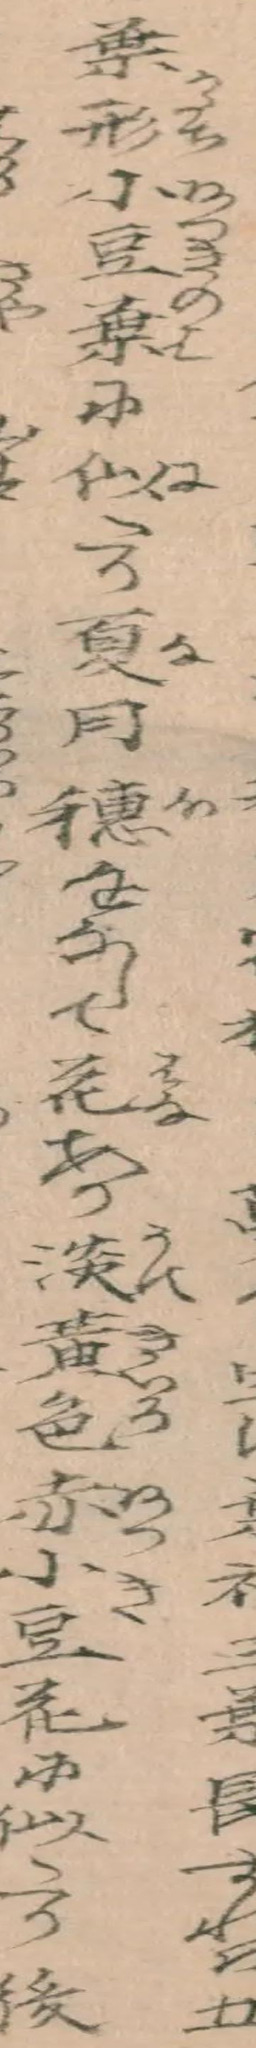葉形小豆葉に似たり夏月穂をなして花あり淡黄色赤小豆花に似たり後
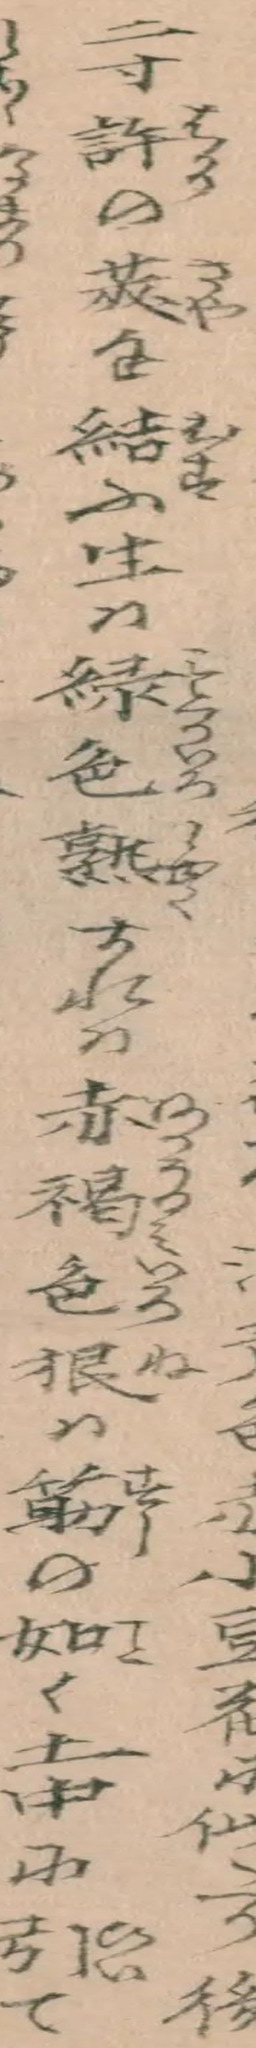二寸許の莢を結ふ生は緑色熟すれは赤褐色根は筋の如く土中に引て
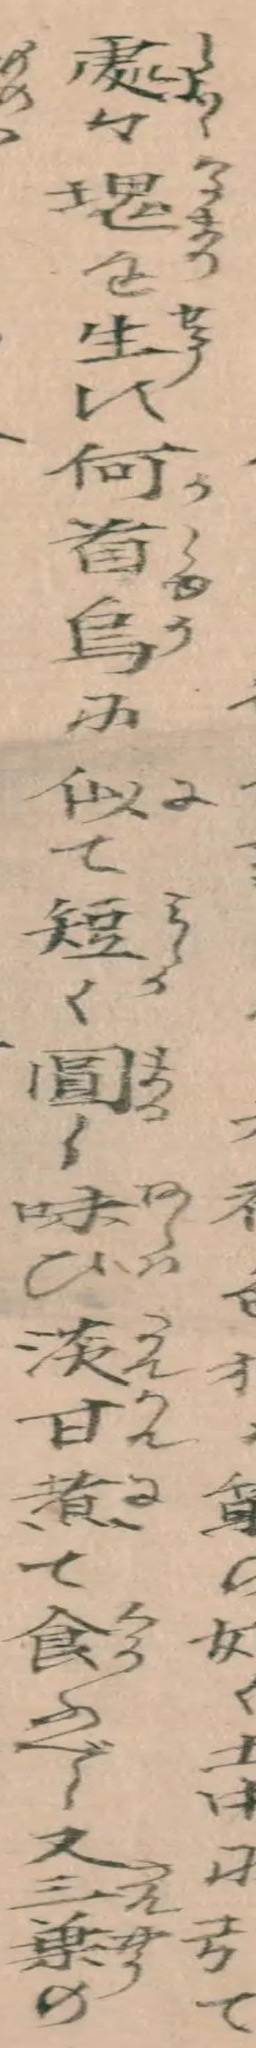処々塊を生す何首烏に似て短く円し味ひ淡甘煮て食ふべし又三葉の

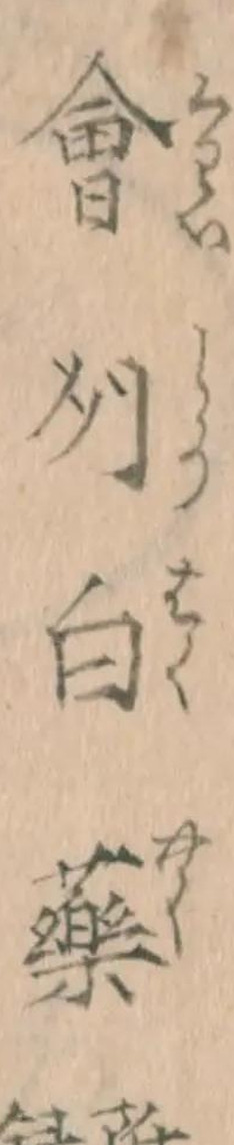会州白薬
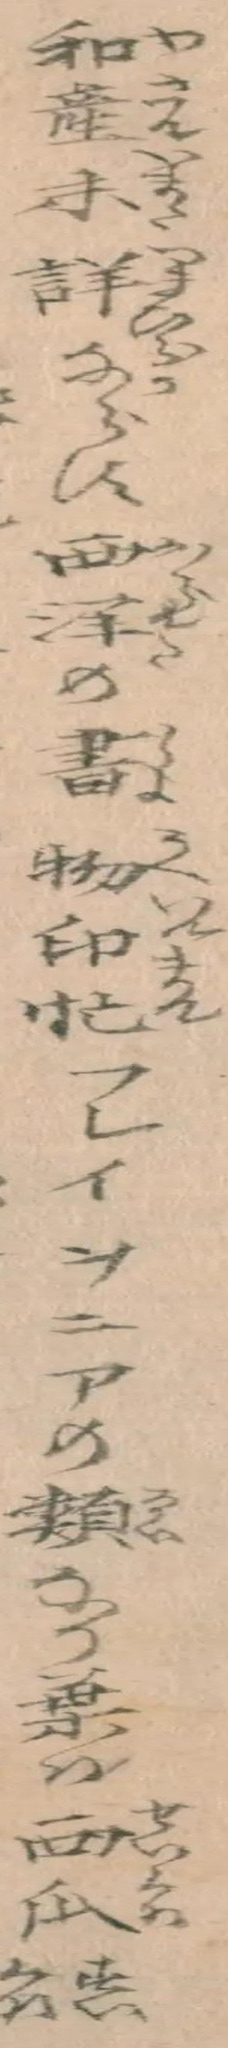和産未詳ならす西洋の書物印忙フレイヲニアの類なり葉は西瓜すいくは
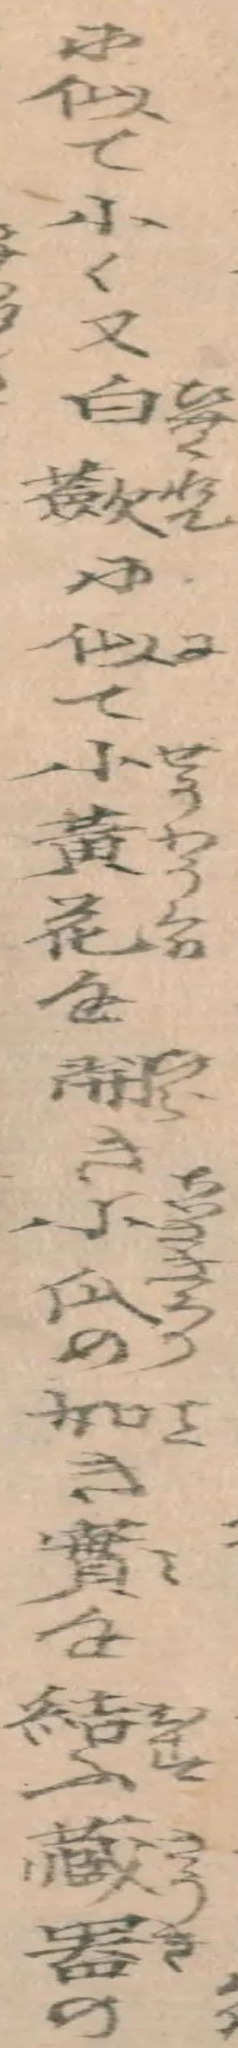に似て小く又白蘞に似て小黄花を開き小瓜の如き実を結ふ蔵器の
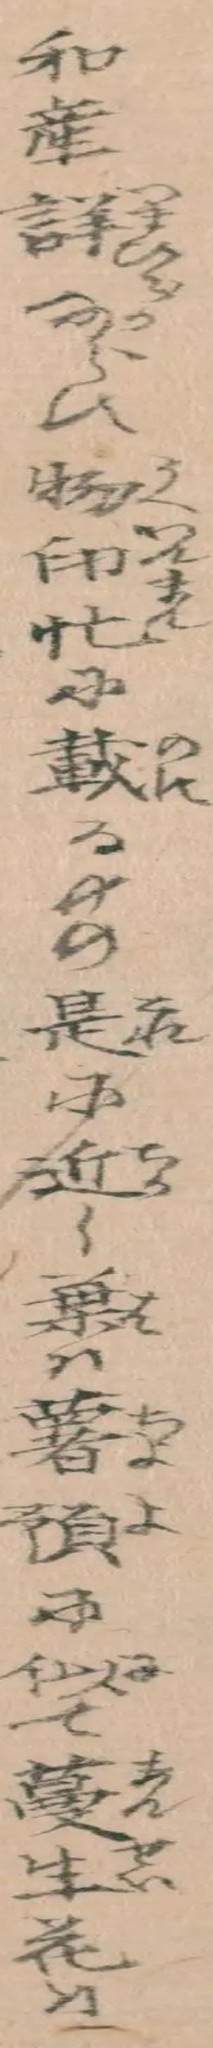和産詳ならす物印忙に載るもの是に近し葉は薯預に似て蔓生花は
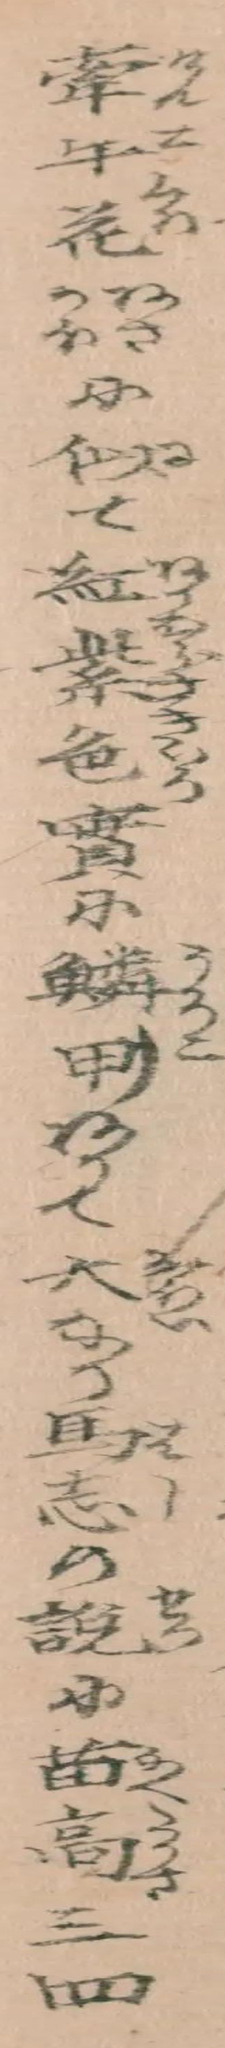牽午花あさかほに似て紅紫色実に鱗甲ありて大なり馬志の説に苗高三四
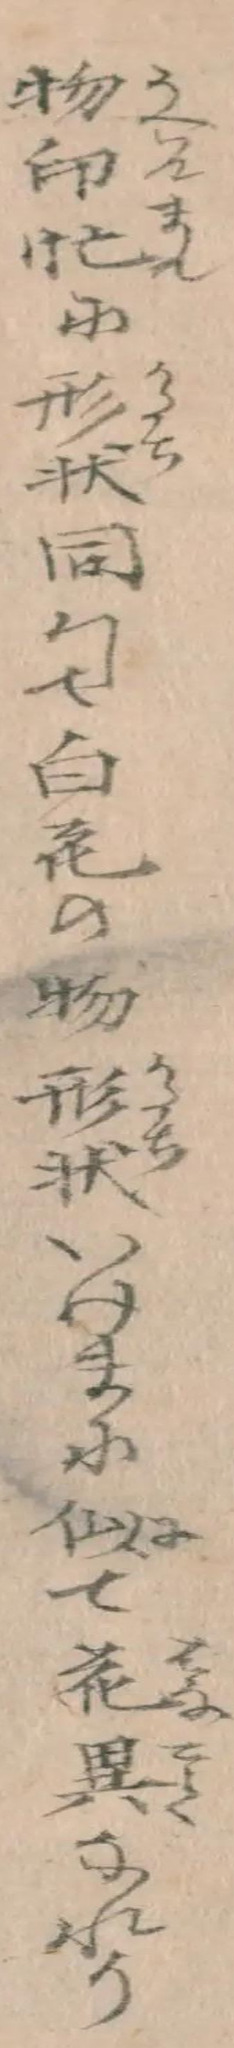物印忙に形状同くして白花の物形状いけまに似て花異なれり

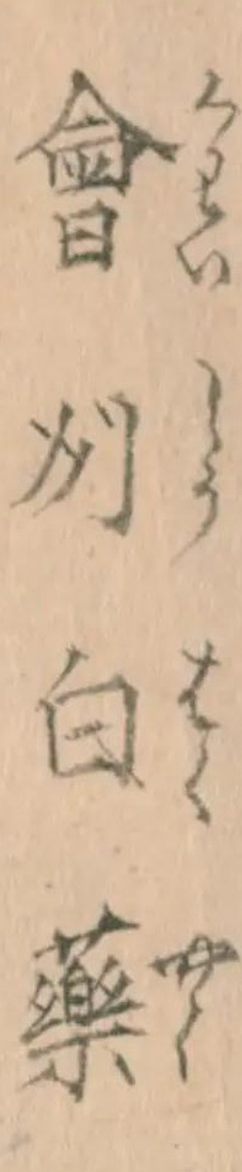会州白薬
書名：本草図譜. 巻28-30
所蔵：国立国会図書館 National Diet Library, JAPAN
